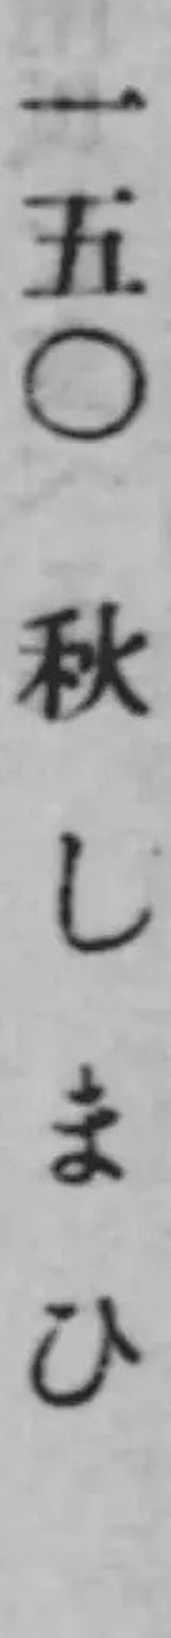一五〇秋しまひ(舊)
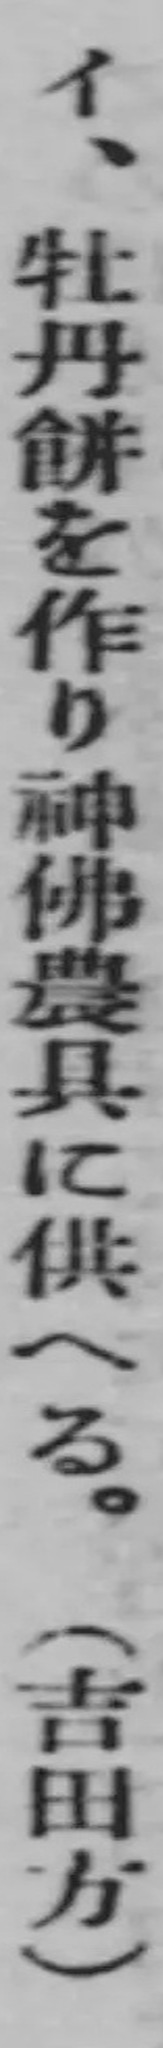イ、牡丹餅を作り神佛農具に供へる。(吉田方)
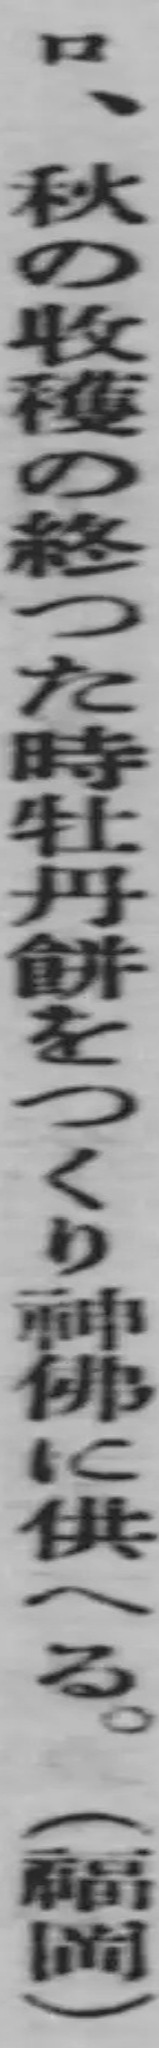ロ、秋の収穫の終つた時牡丹餅をつくり神佛に供へる。(福岡)
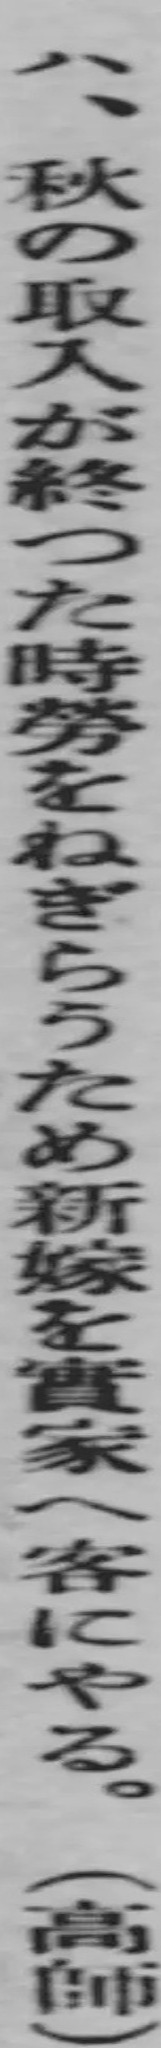ハ、秋の取入が終つた時勞をねぎらうため新嫁を實家へ客にやる。(高師)
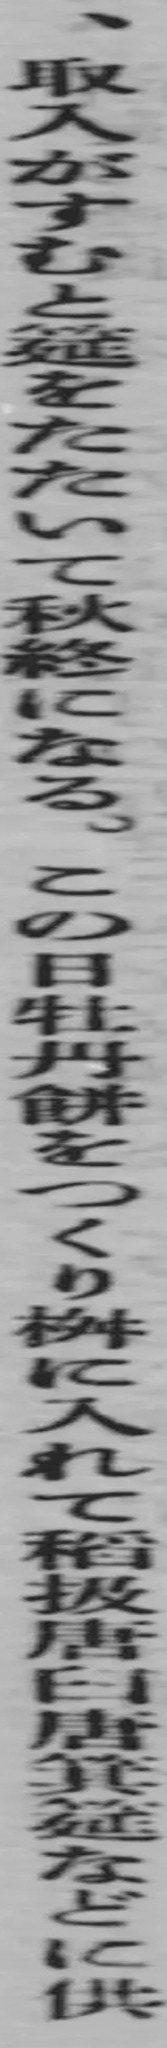ニ、取入がすむと筵をたたいて秋終になる。この日牡丹餅をつくり桝に入れて稻扱唐臼唐箕筵などに供
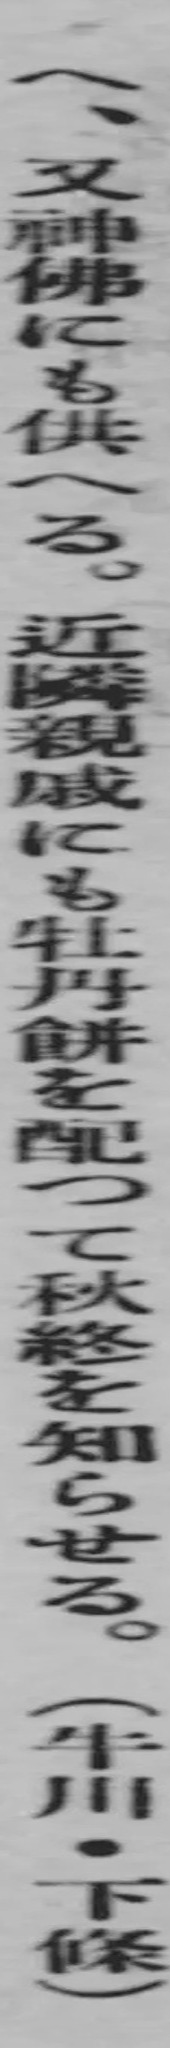へ、又神佛にも供へる。近隣親戚にも牡丹餅を配つて秋終を知らせる。(牛川・下條)
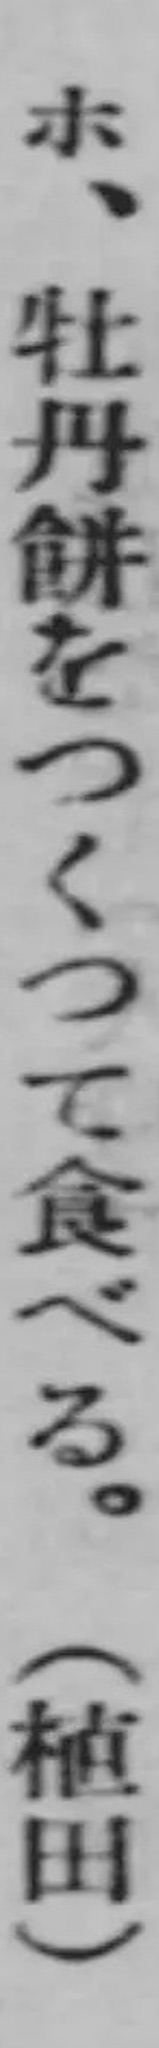ホ、牡丹餅をつくつて食べる。(植田)
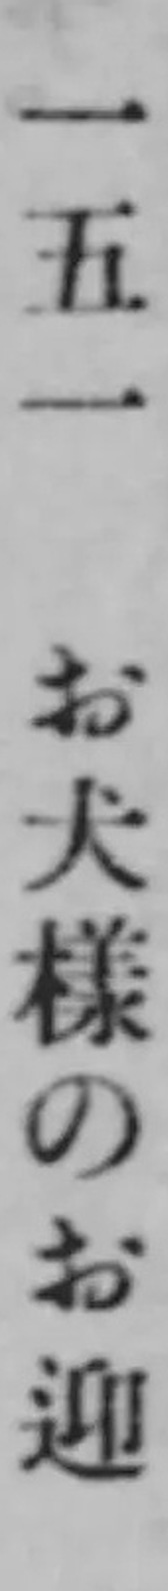一五一お犬様のお迎
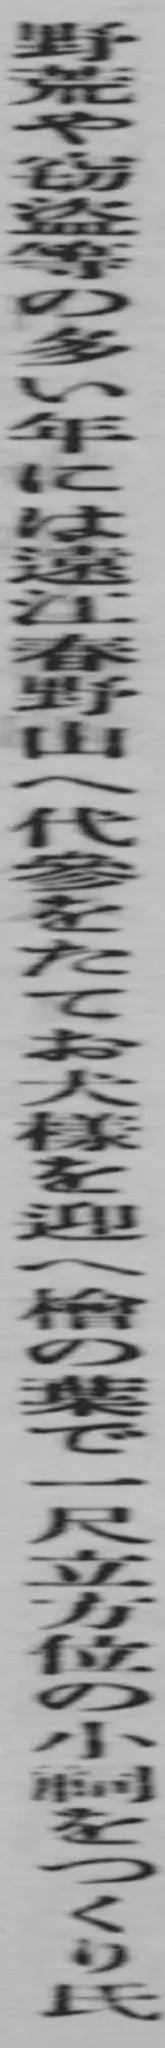野荒や窃盜等の多い年には遠江春野山へ代參をたてお犬様を迎へ檜の葉で一尺立法位の小祠をつくり氏
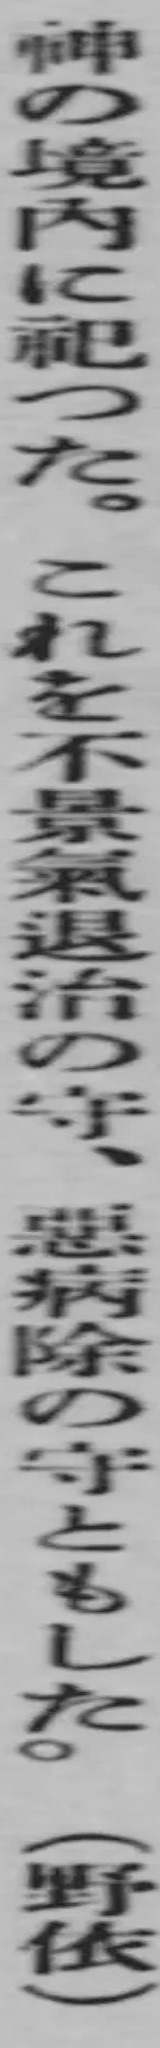神の境内に祀つた。これを不景氣退治の守、惡病除の守ともした。(野依)

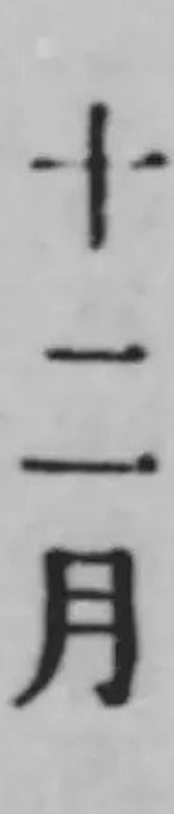十二月
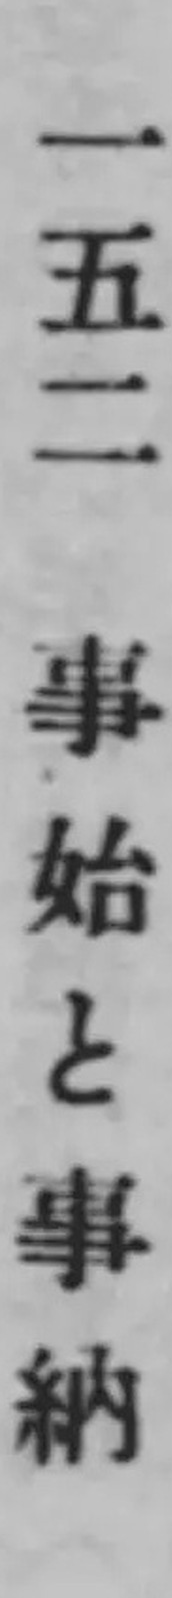一五二事始と事納
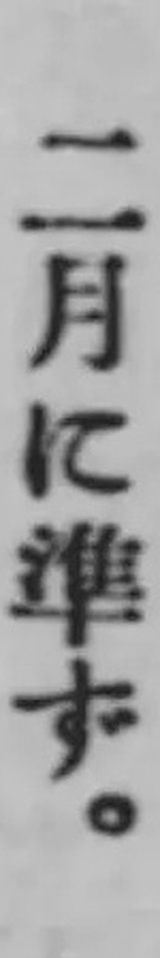二月に準ず。
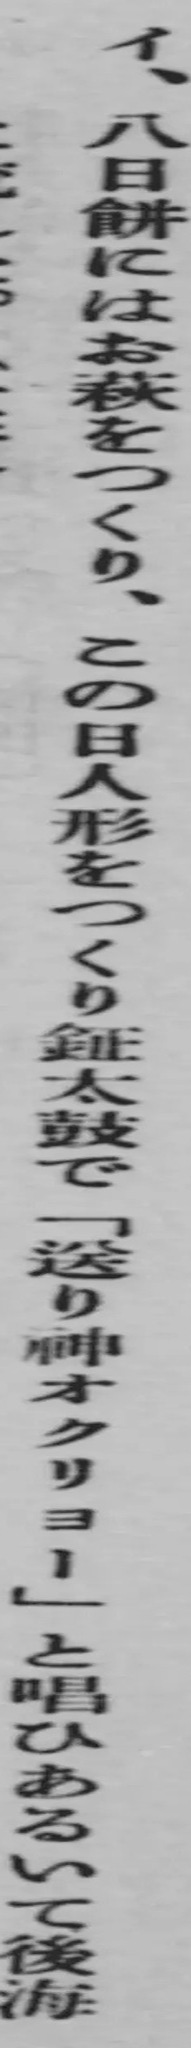イ、八日餅にはお萩をつくり、この日人形をつくり鉦太鼓で「送り神オクリヨー」と唱ひあるいて後海
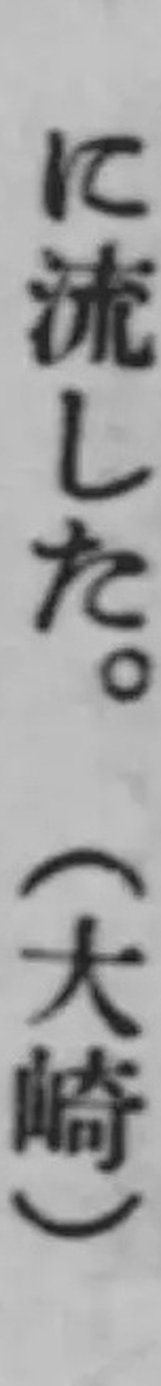に流した。(大崎)
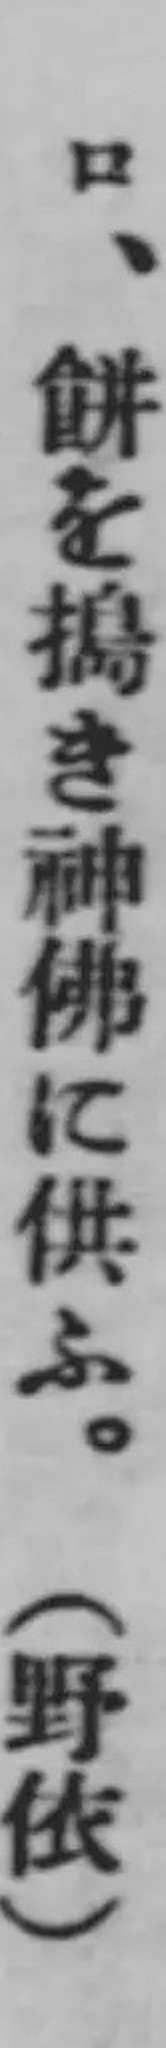ロ、餅を搗き神佛に供ふ。(野依)
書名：豊橋の年中行事
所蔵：国立国会図書館 National Diet Library, JAPAN
